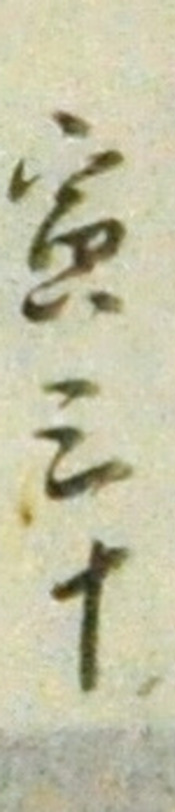寅三十
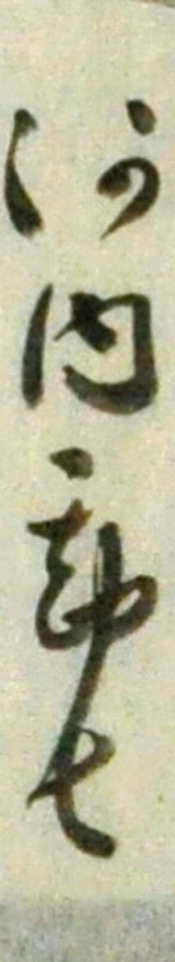河内勘七
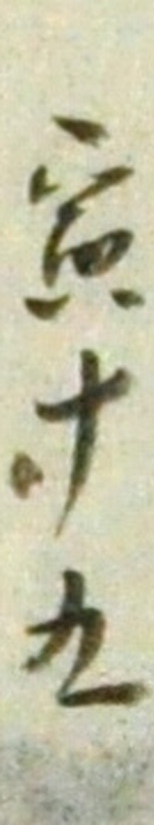寅十九
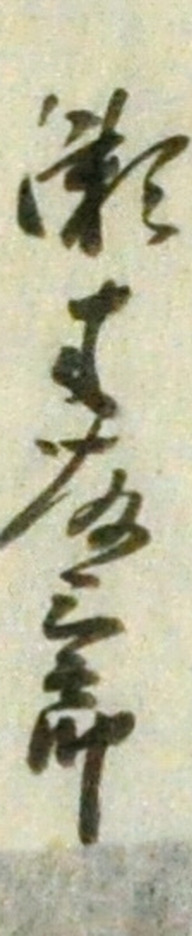瀬木藤三郎
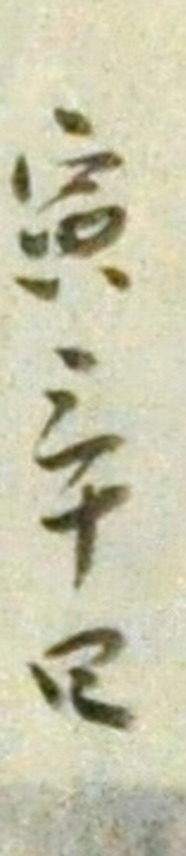寅三十四
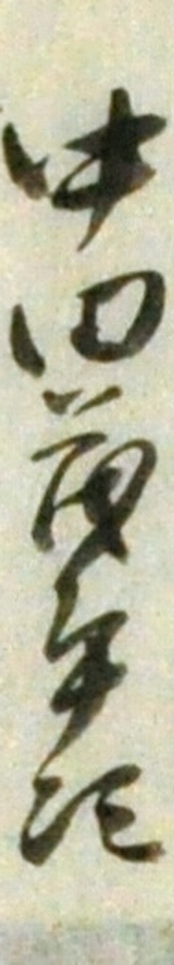中田茂平次
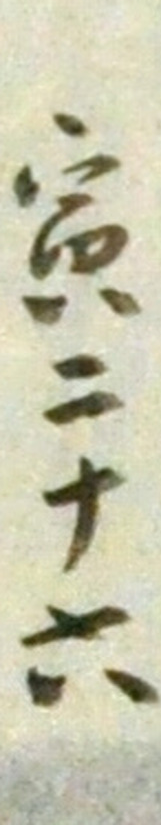寅二十六
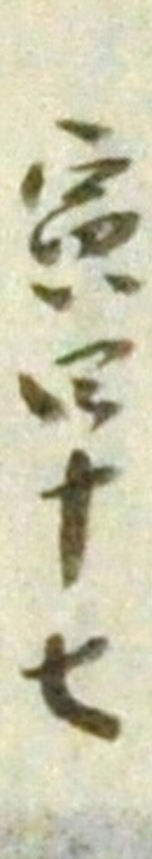寅四十七
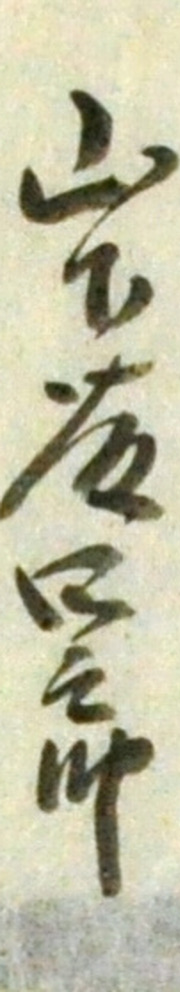山下藤四郎
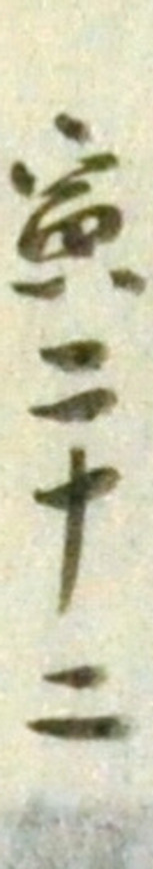寅二十二
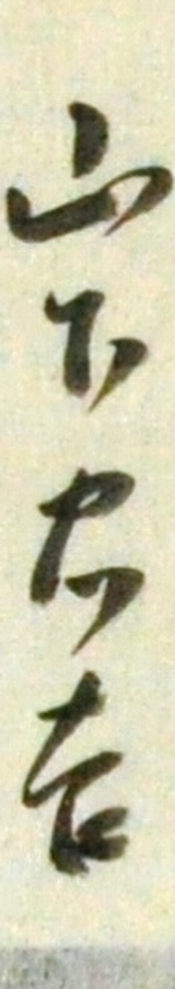山下忠吉
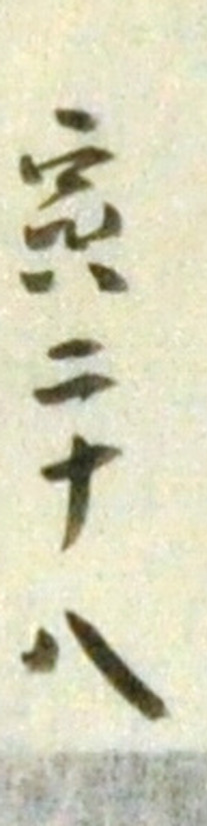寅二十八
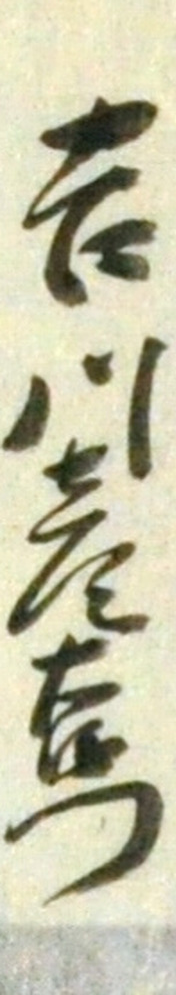吉川彦右衛門
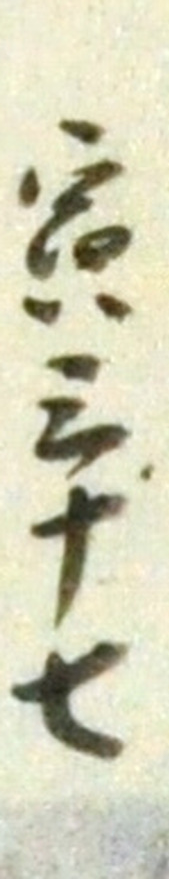寅三十七
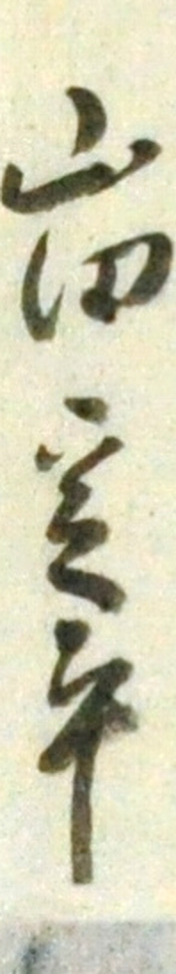山田定平
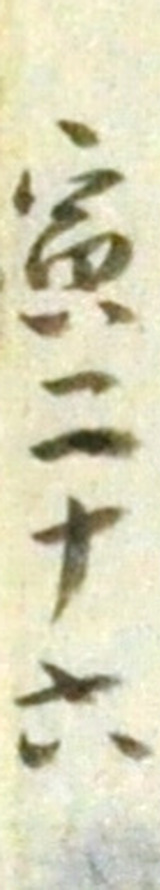寅二十六
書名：罪状判決
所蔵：伊那市立高遠町図書館・合同会社AMANE
